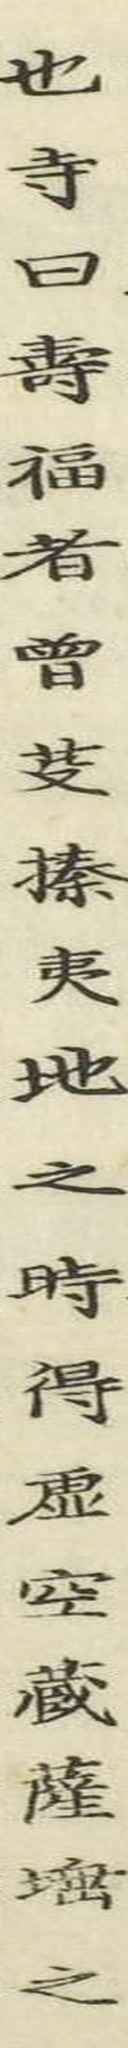也寺曰寿福者曾芟搸夷地之時得虚空蔵薩埵之
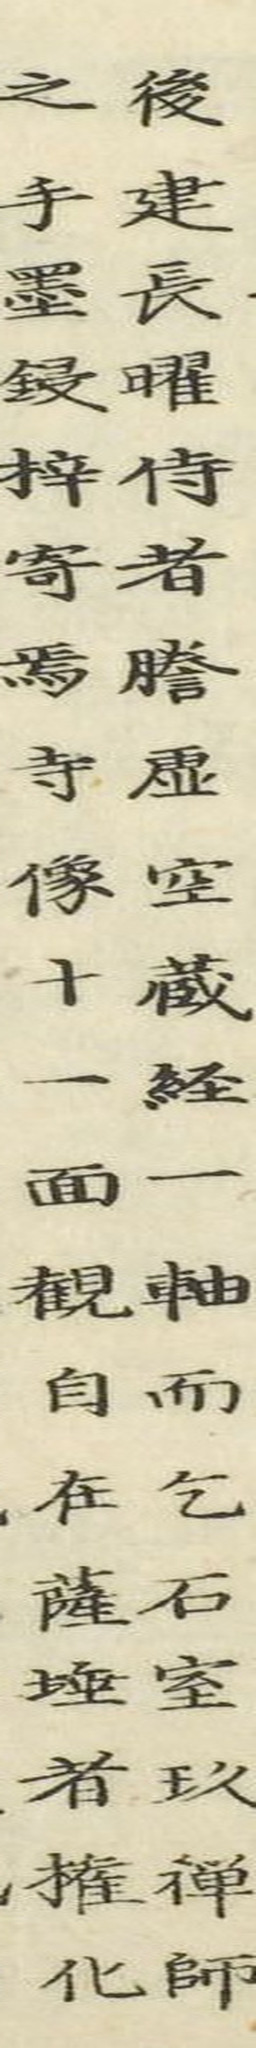之手墨鋟梓寄焉寺像十一面観自在薩埵者権化
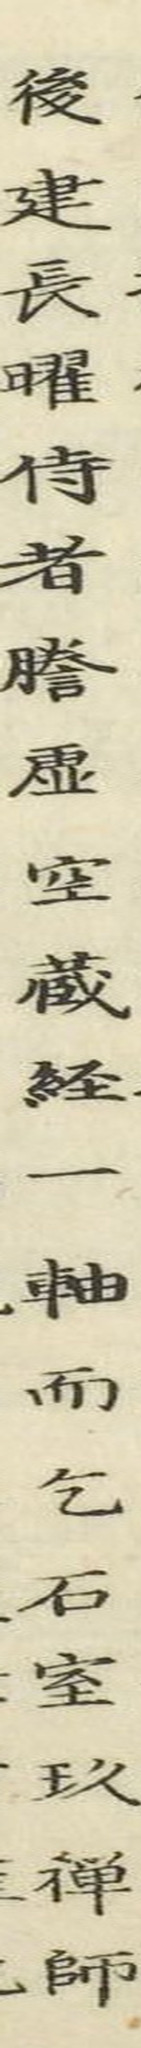後建長曜侍者謄虚空蔵経一軸而乞石室玖禅師
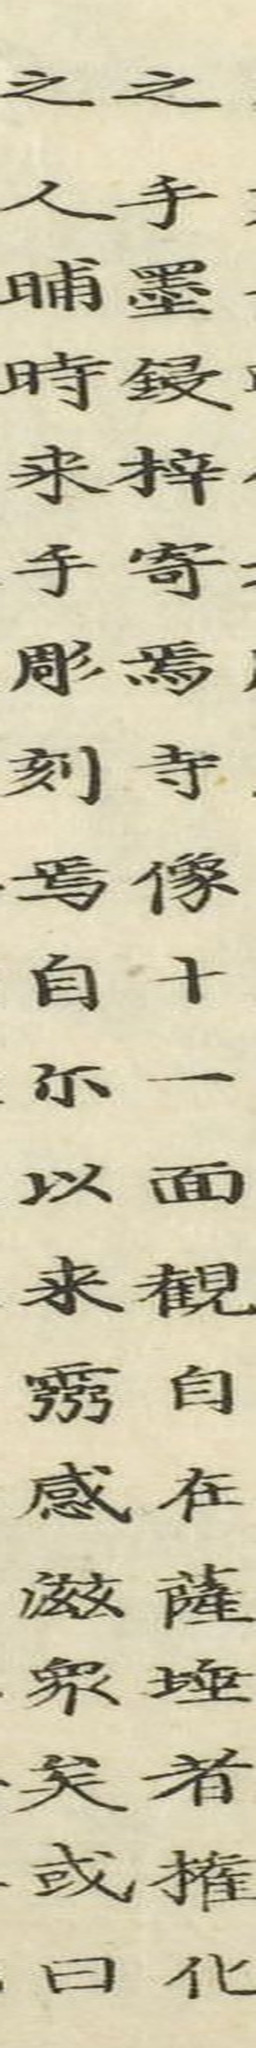之人晡時来手彫刻焉自尓以来霛感滋衆矣或曰
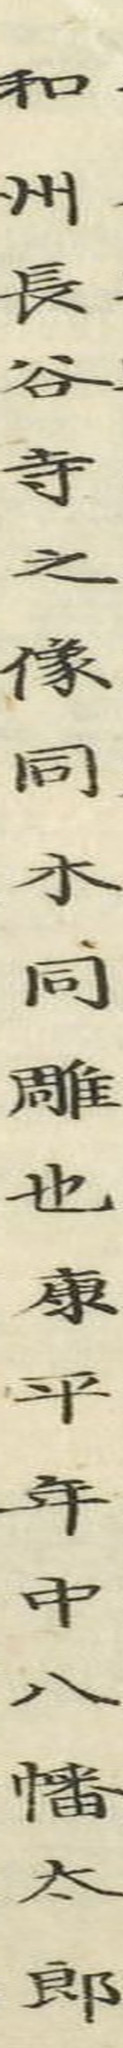和州長谷寺之像同木同雕也康平年中八幡太郎
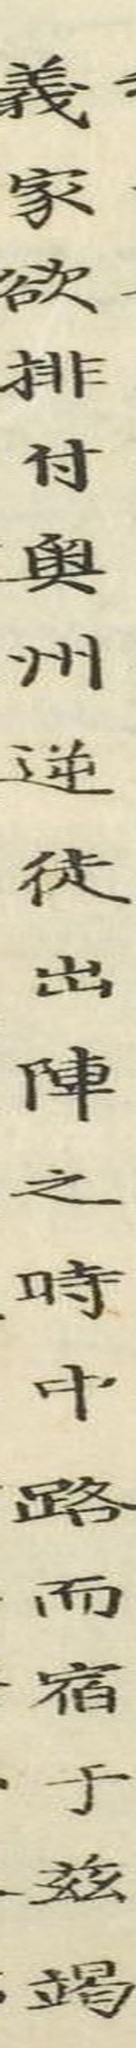義家欲排付奥州逆徒出陣之時中路而宿于茲竭
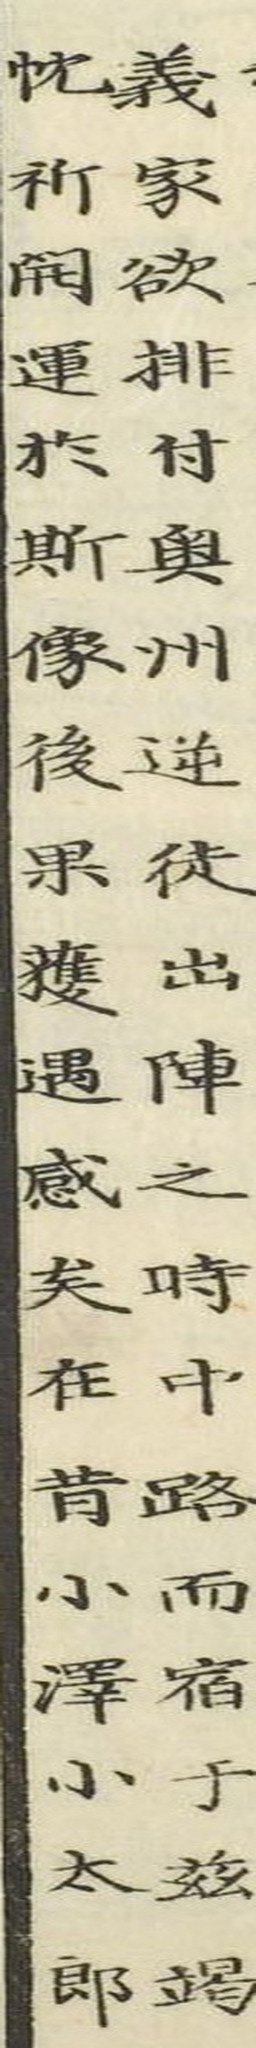帎祈開運於斯像後果獲遇感矣在昔小沢小太郎
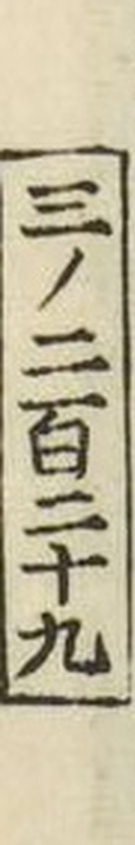三ノ二百二十九
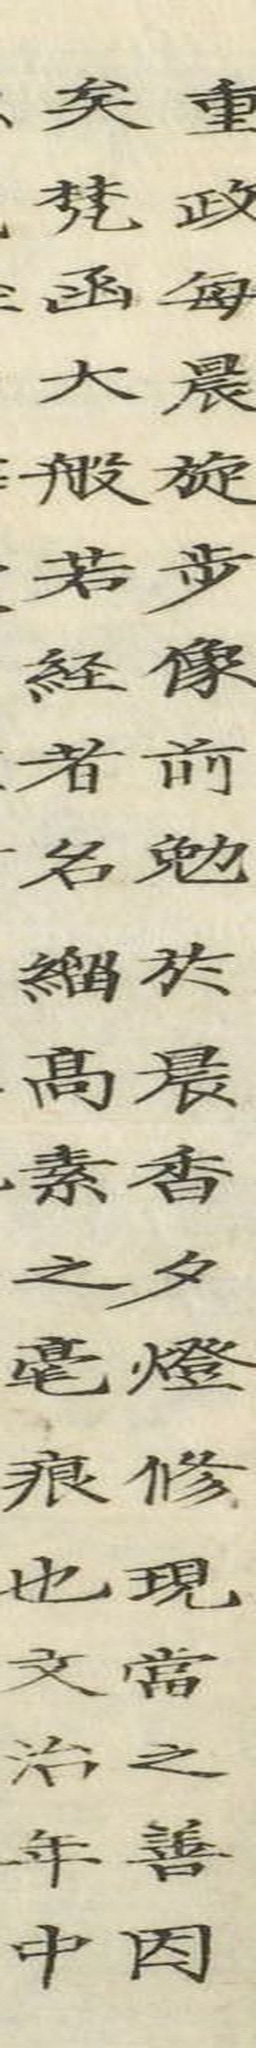矣梵函大般若経者名𦃓高素之毫痕也文治年中
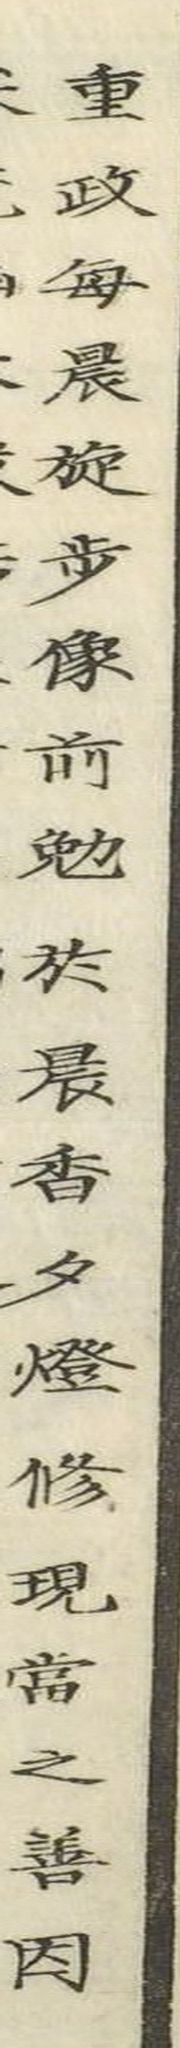重政毎晨旋歩像前勉於晨香夕燈修現当之善因
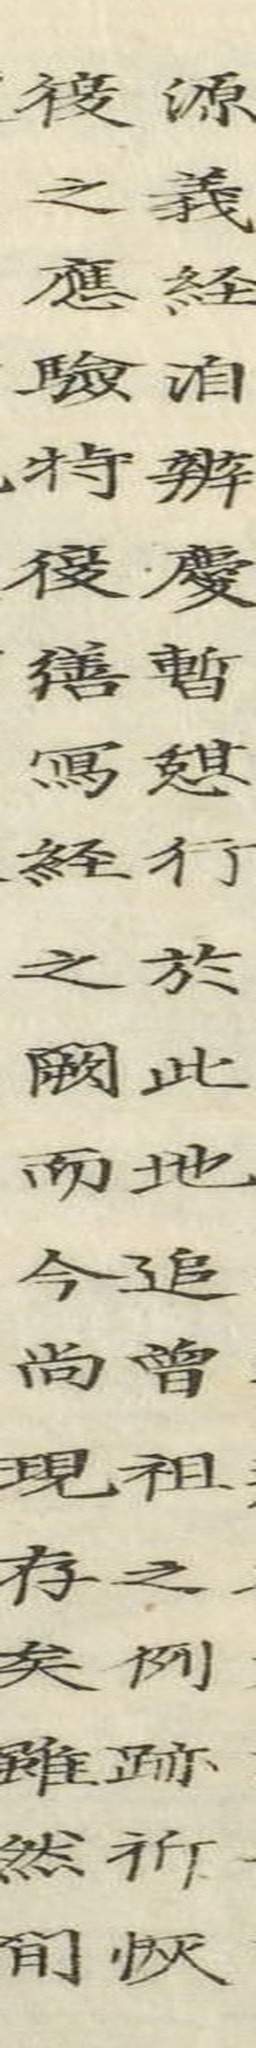復之応験特復繕写経之闕而今尚現存矣雖然間
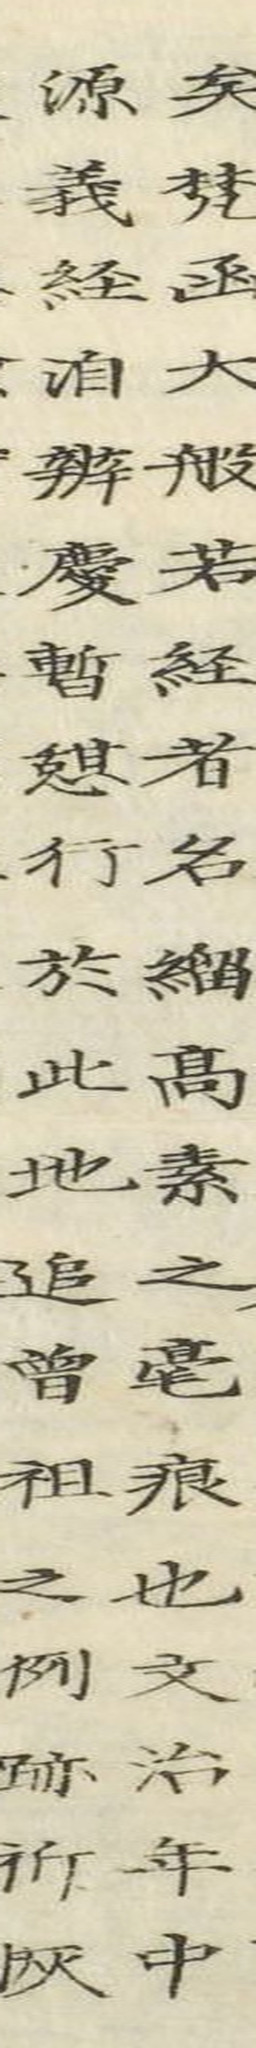源義経泊弁慶暫憩行於此地追曾祖之例跡祈恢
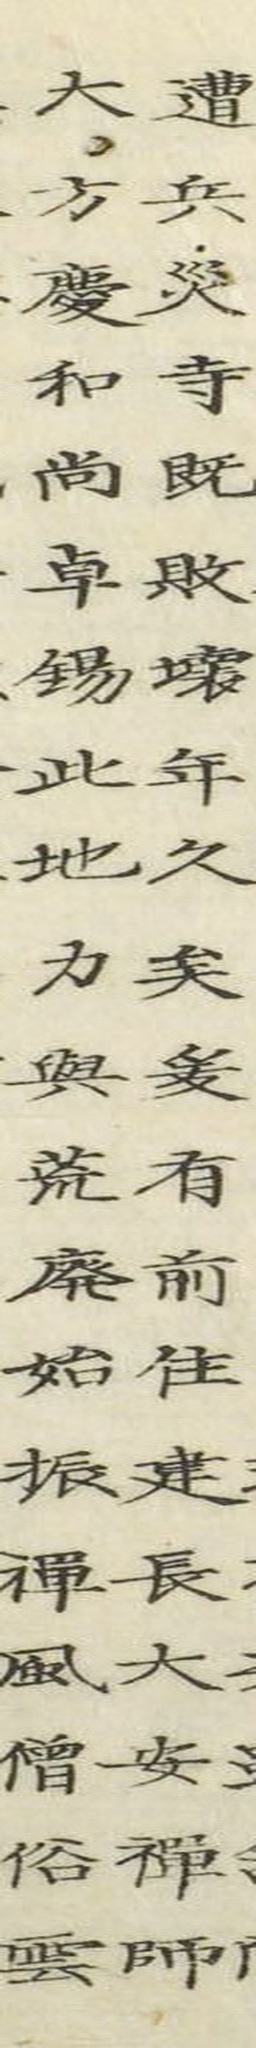大方慶和尚卓錫此地力与荒廃始振禅風僧俗雲
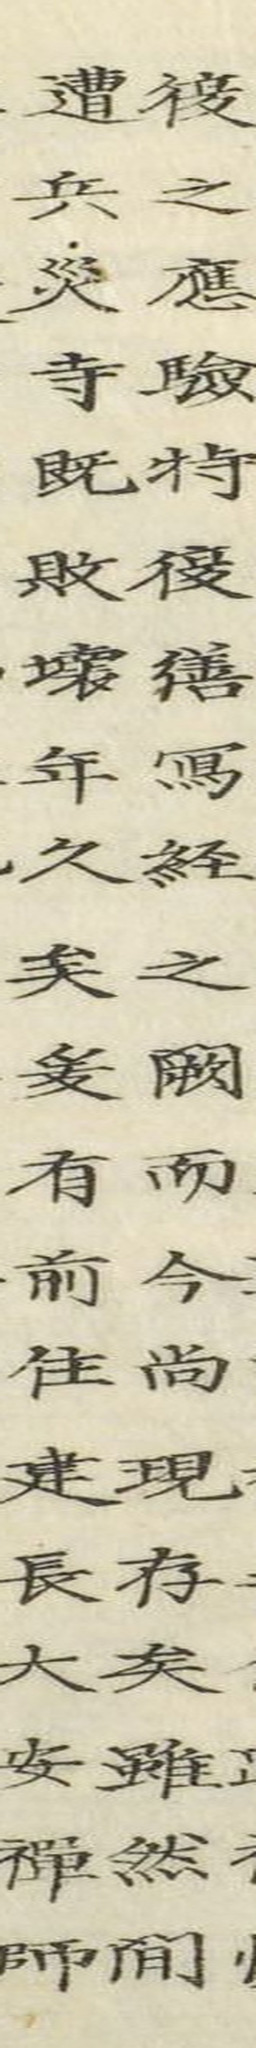遭兵災寺既敗壊年久矣爰有前住建長大安禅師
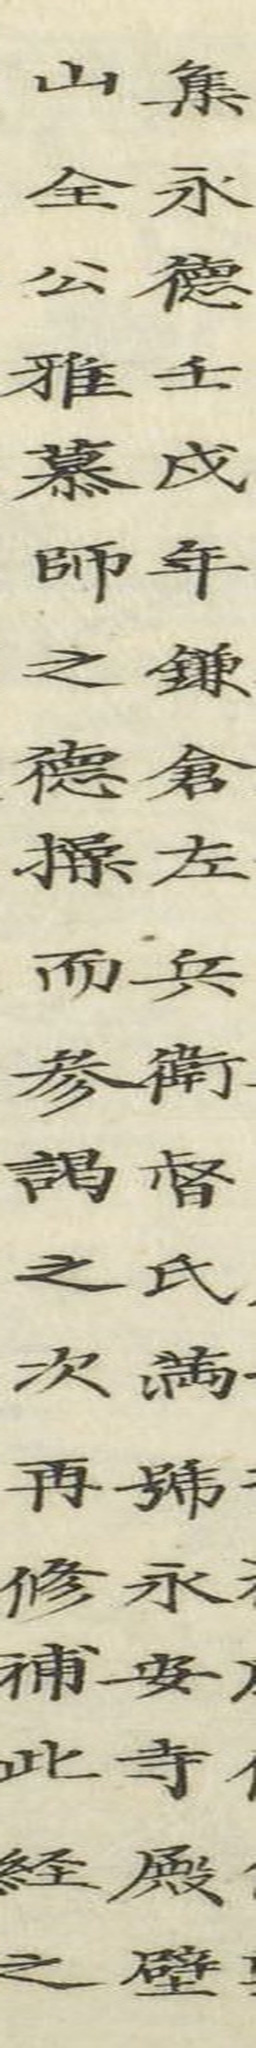山全公雅慕師之徳操而参謁之次再修補此経之
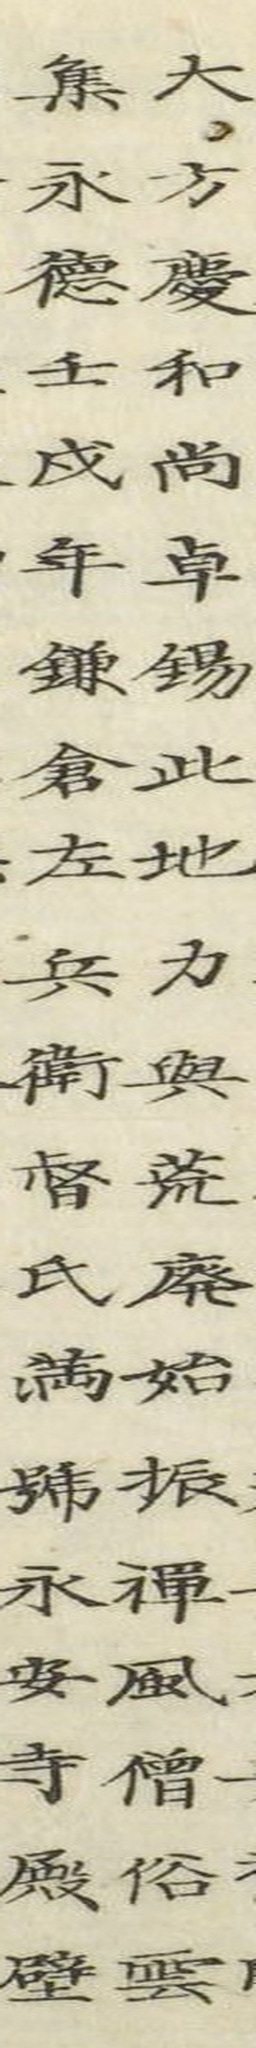集永徳壬戌年鎌倉左兵衛督氏満號永安寺殿壁
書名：江戸名所図会 20巻 巻之10
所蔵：東京学芸大学教育コンテンツアーカイブ
